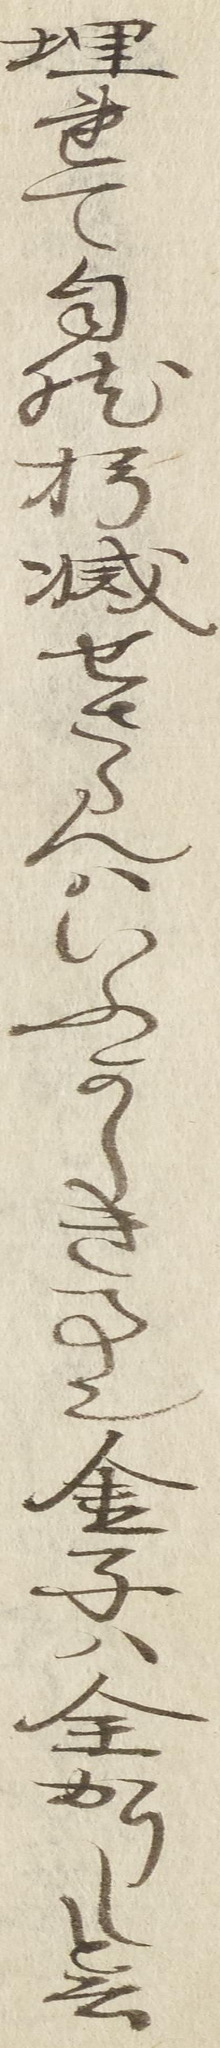埋れて自然朽滅せさらんはいふかしき事也金子ハ全かりしと云
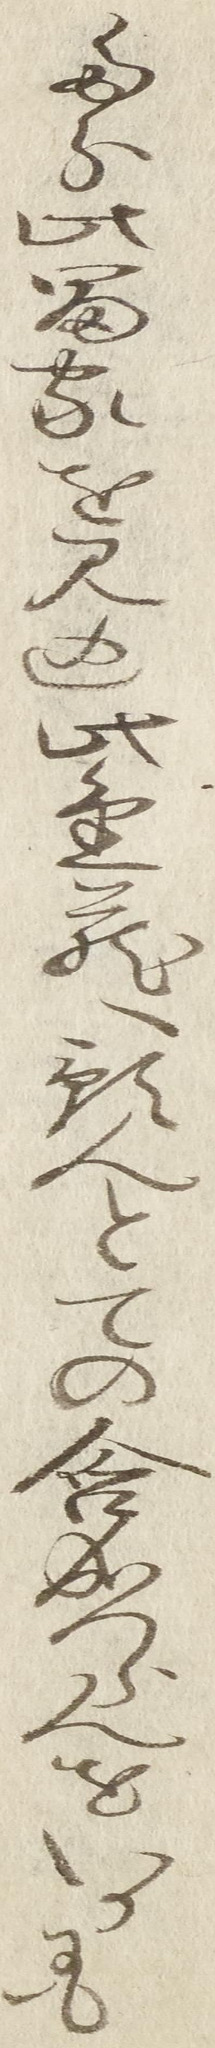多分此冨家を見込此金蔵へ預んとての含成つらんをいかにも
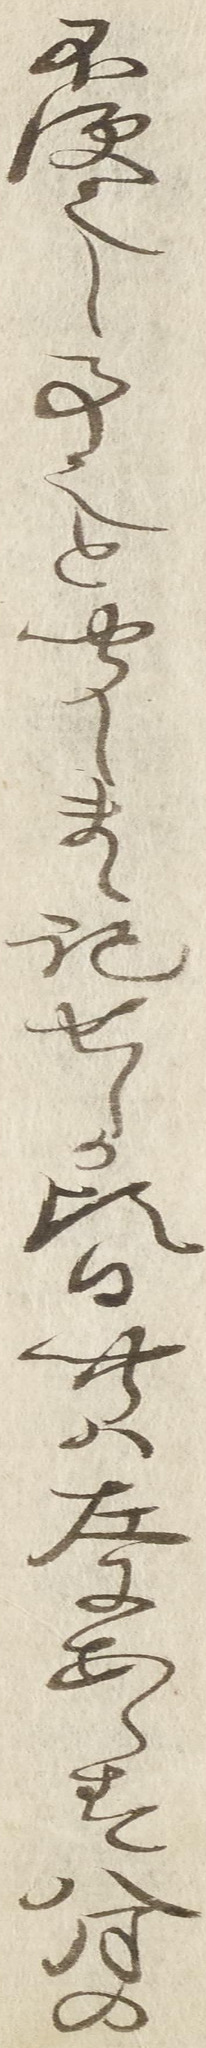不便也し事也と聞しまゝ記せしか比日聞は左にあらす八月の
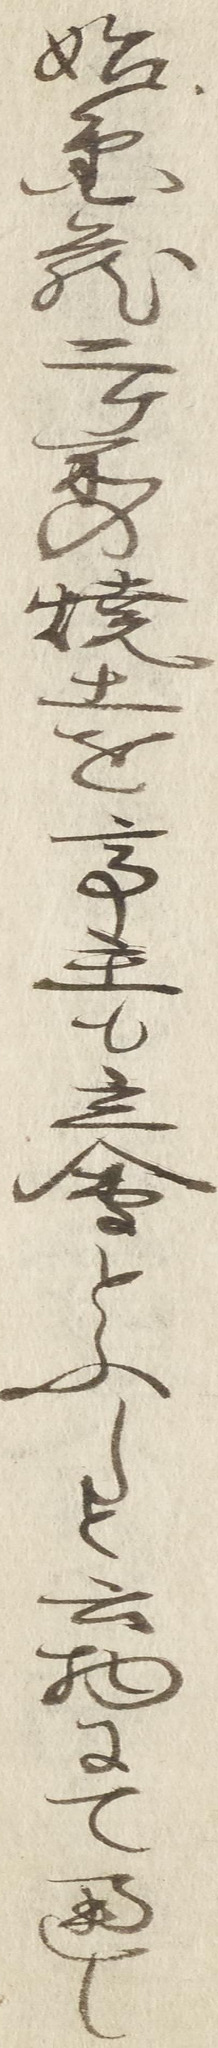始金蔵二ヶ所の焼土を亭主も立会とふしと云物にて通し
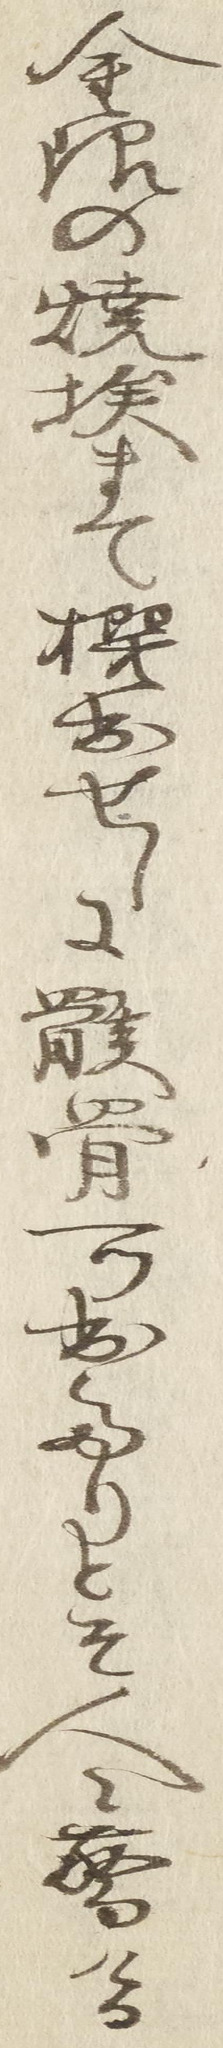金銀の焼埃まて選出せしに骸骨一ッ出たりとそ人々驚ける
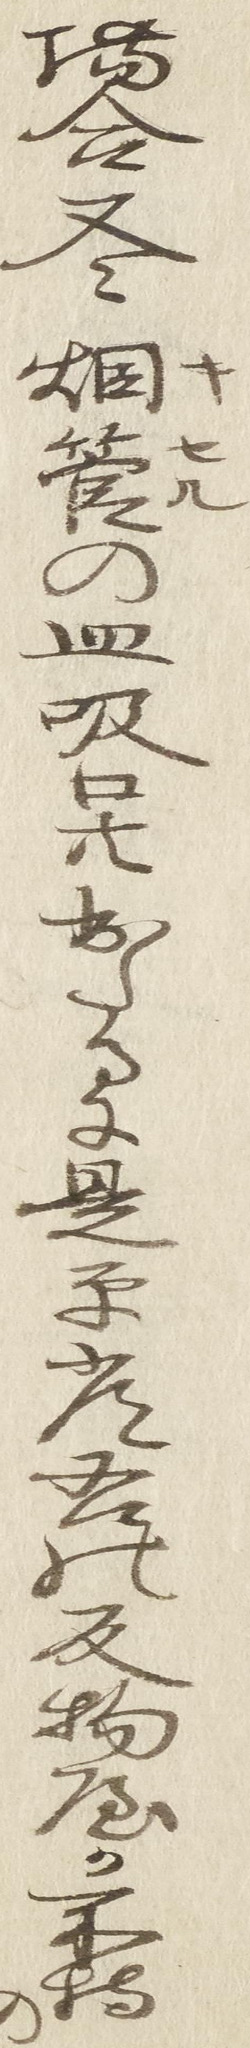場合又々烟管の皿吸口共出たるに是平常右の反物屋か所持の
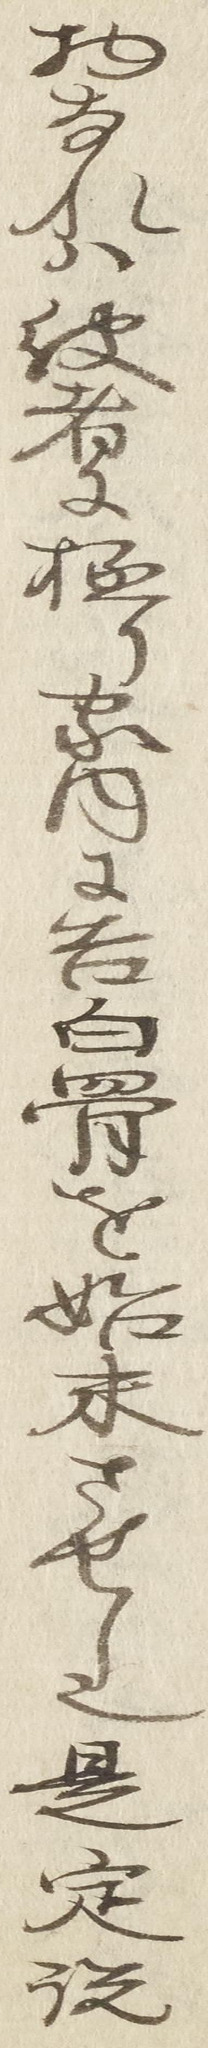物なれは彼者に極り家内に告白骨を始末させし也是定説
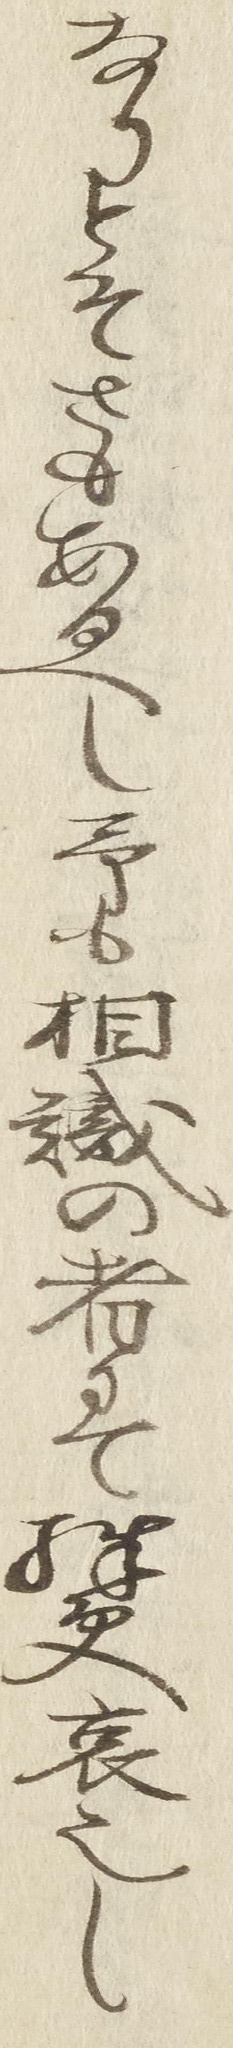なりとそさもあるへし予も相識の者にて殊更哀也し
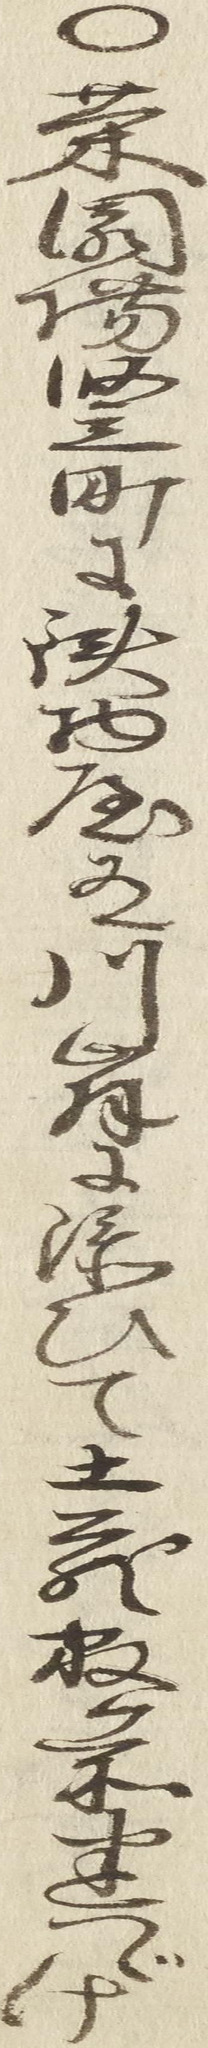〇菜園場竪町に鉄物屋有川岸に添ひて土蔵数ヶ所建つゞけ
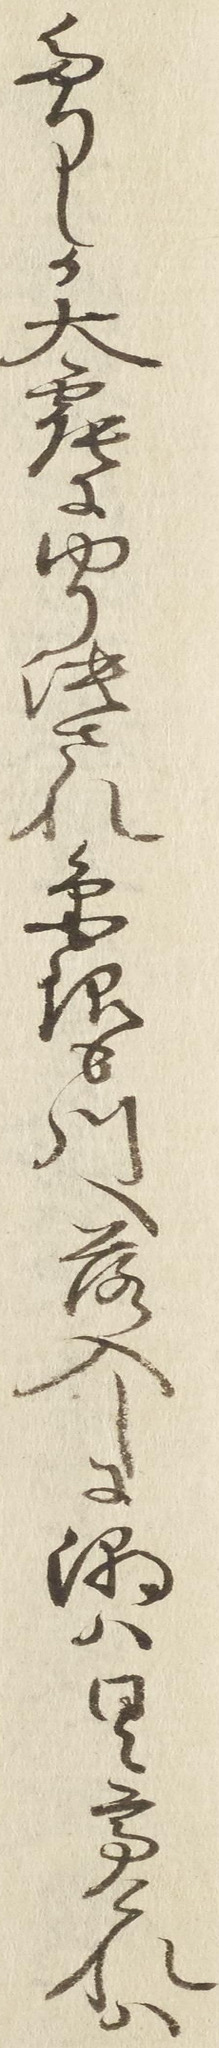たりしか大震にゆり潰され金銀も川へ落入しに潮は日々高けれは
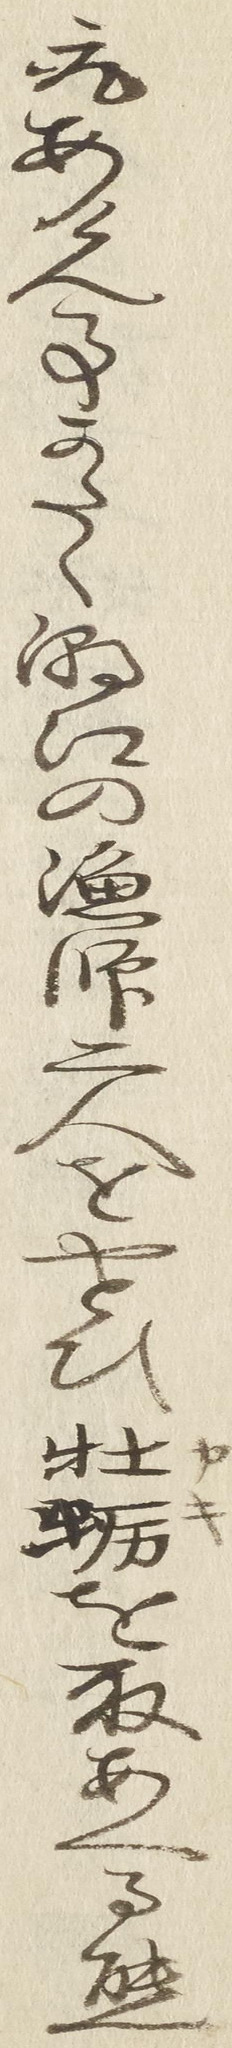取あけん事かたく潮江の漁師二人をやとひ牡蠣を取あくる熊
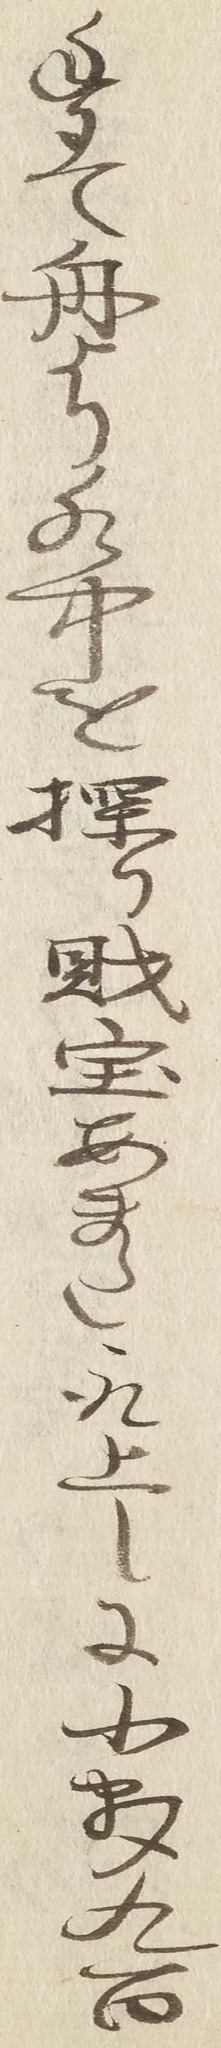手にて舟より水中を探り財宝あまた取上しに小判九百
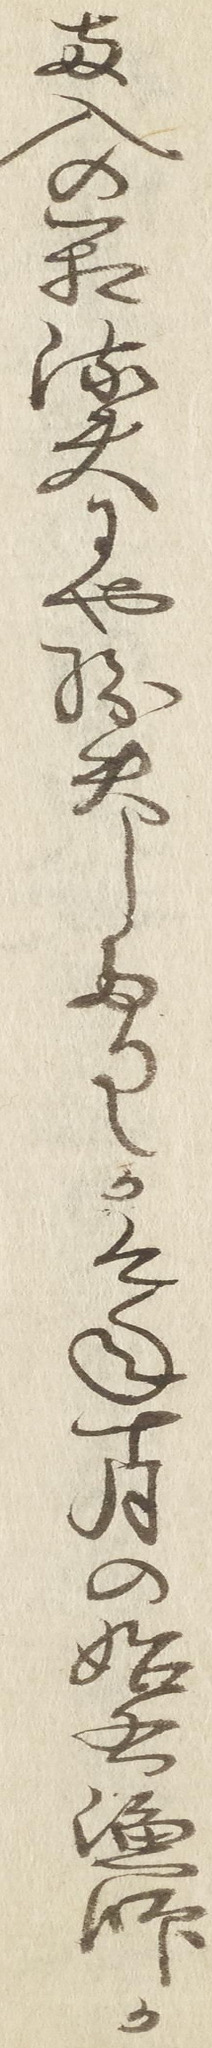両入の箱流失にや紛失したりしか今年十月の始右漁師か
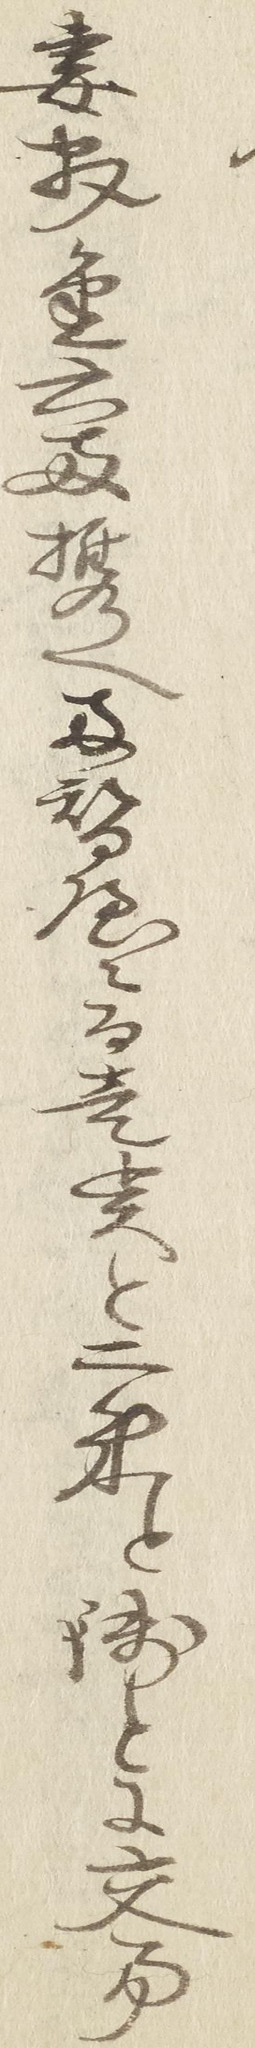妻判金六両携へ両替屋にて壱歩と二朱と銭とに交易
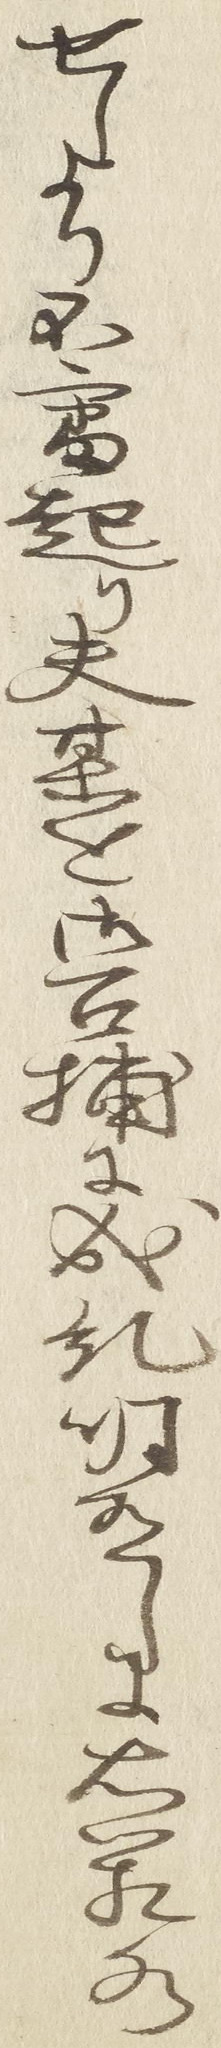せしより不審起り夫某を御召捕に成糾明有しに右箱水
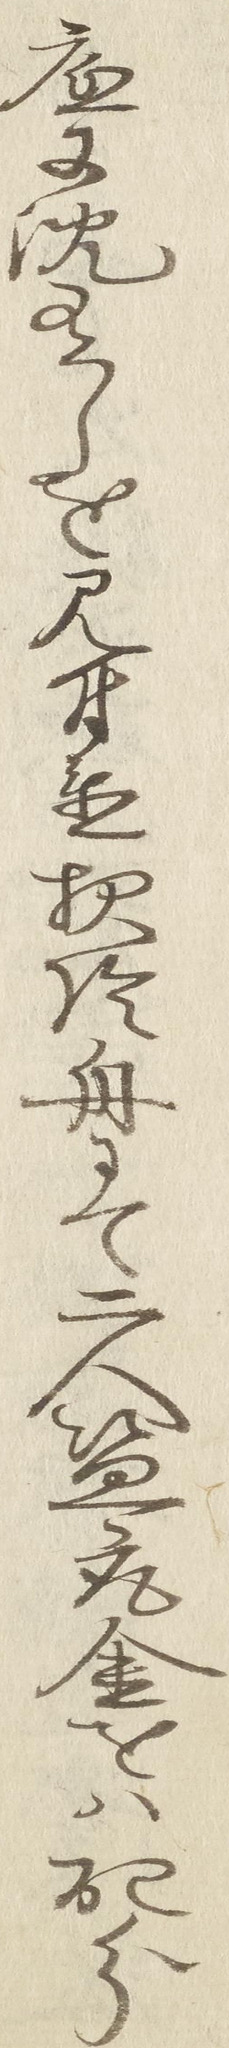底に沈有しを見付置夜冷舟にて二人盗取金をは配分
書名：地震記　上
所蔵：東京大学地震研究所図書室 Earthquake Research Institute Library, The University of Tokyo, JAPAN
